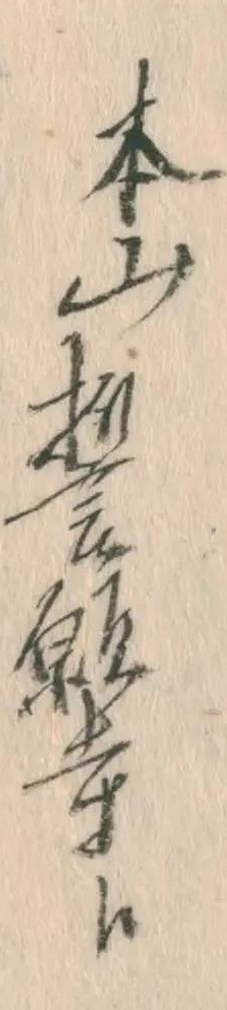本山誓願寺え
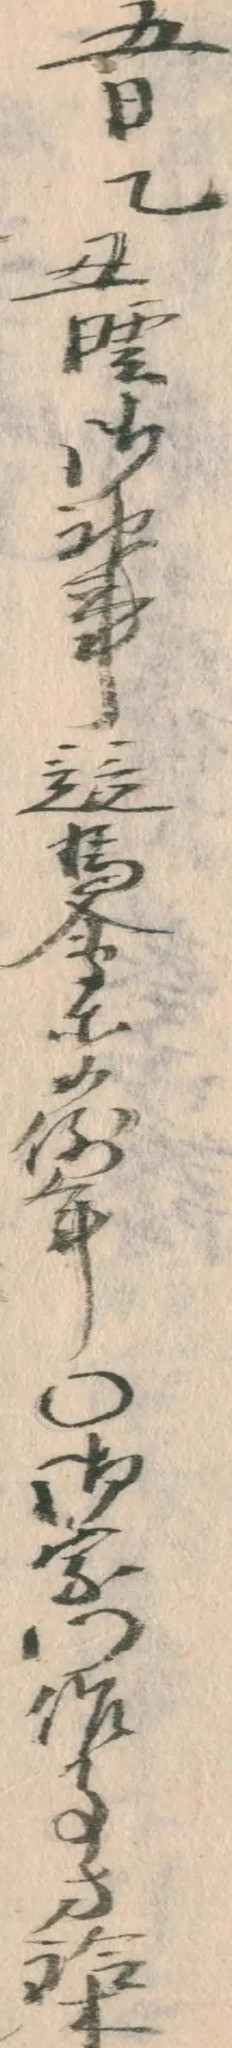五日乙丑曇御神事競馬會等如例年〇御家門作事方鈴木
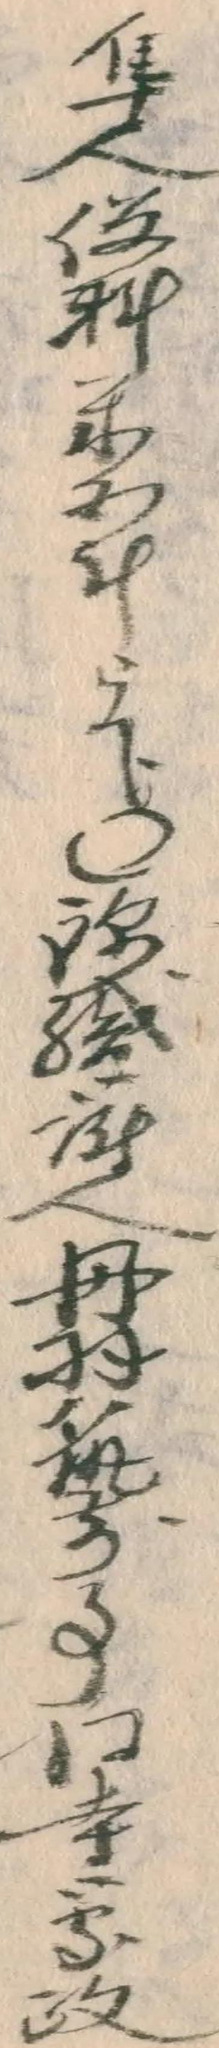隼人役科米五斗被下○錦織御附人丹羽筑前事同寺御家政
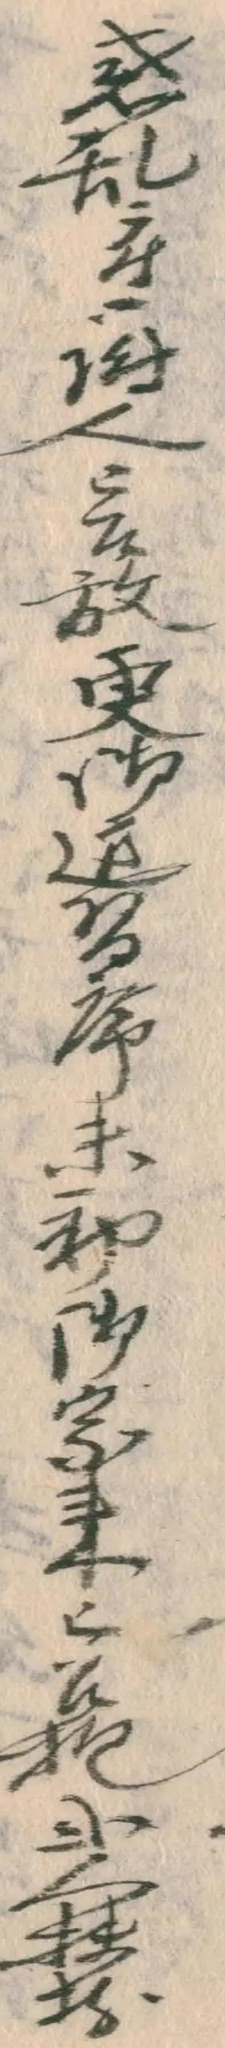惑乱ニ付附人被召放更御近習席未勤御家来被召抱弐人扶持
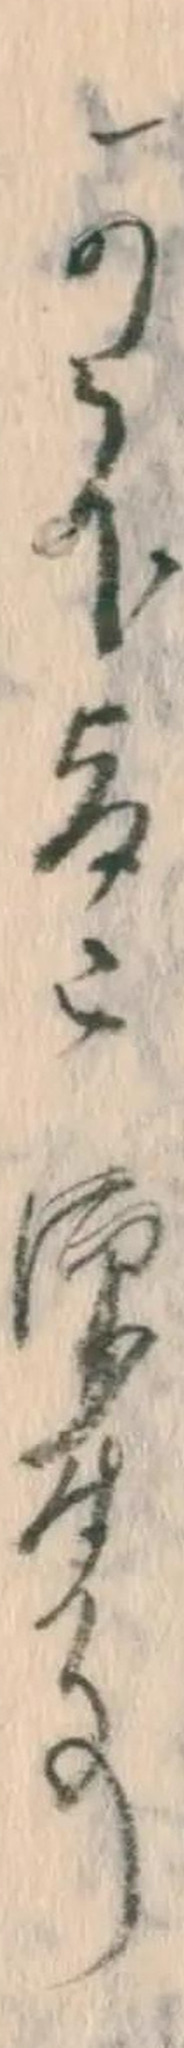可被下旨被仰付事
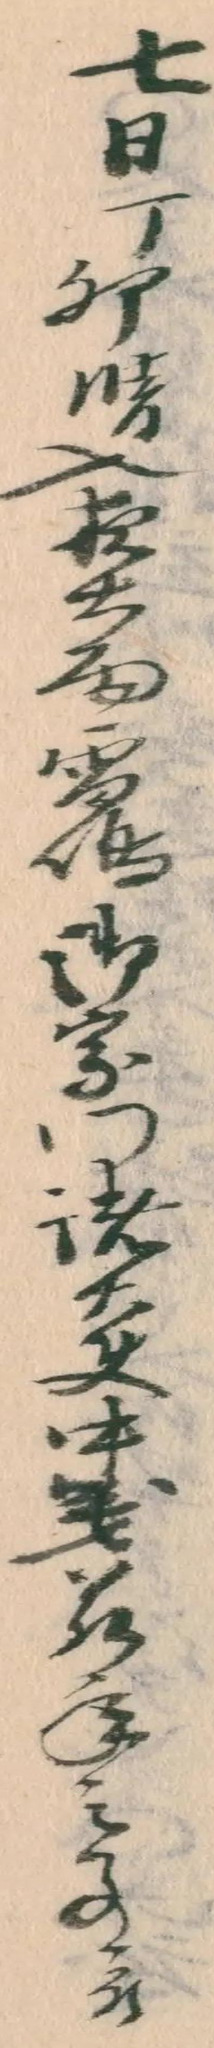七日丁卯晴入夜大雨雷鳴御家門諸大夫中義若年之事ニ付
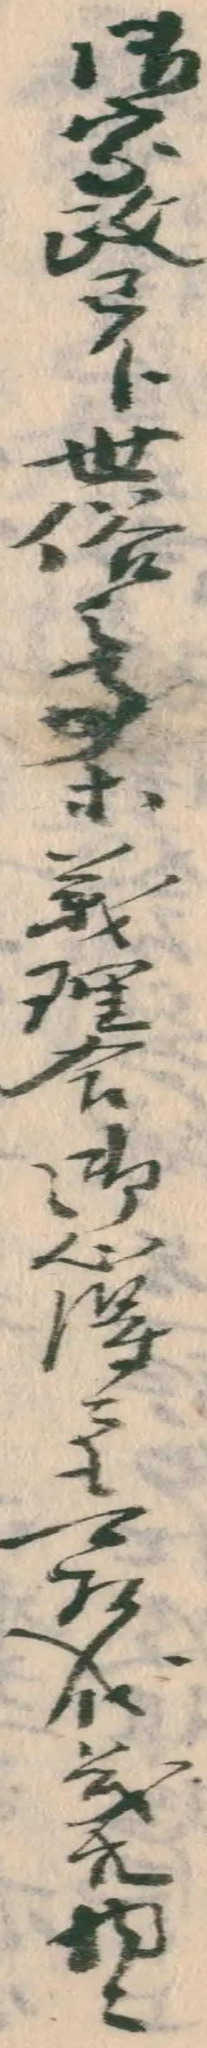御家政已下世俗之事等義理合御心得ニも可相成義共内々
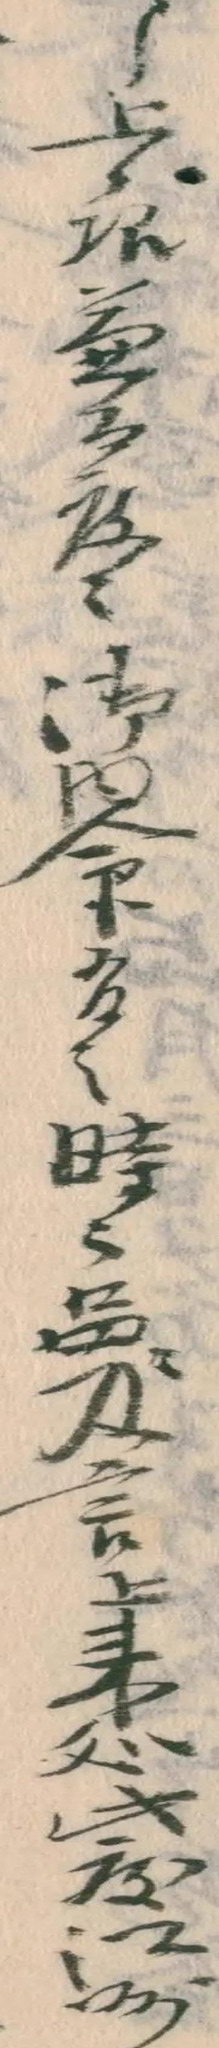申上候様兼而度々御内命有之時々品々及言上来処此度江州
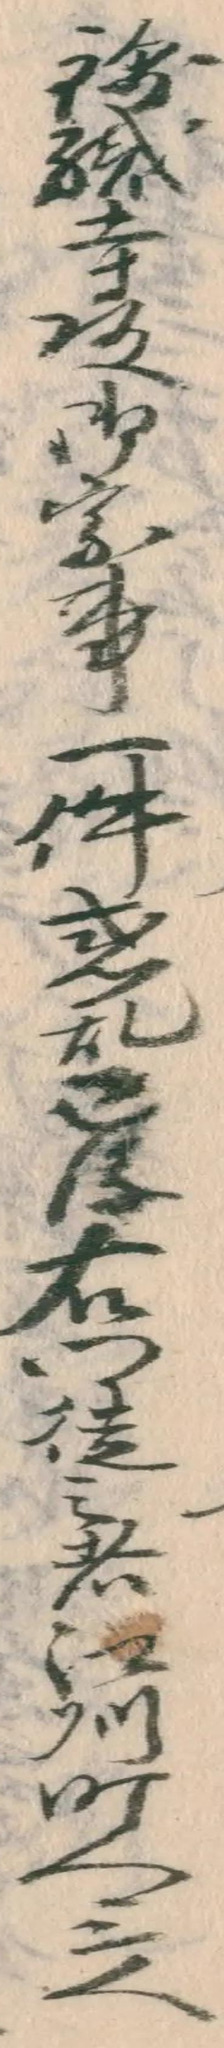錦織寺殿御家事一件惑乱已存右門徒之者江州町人三人
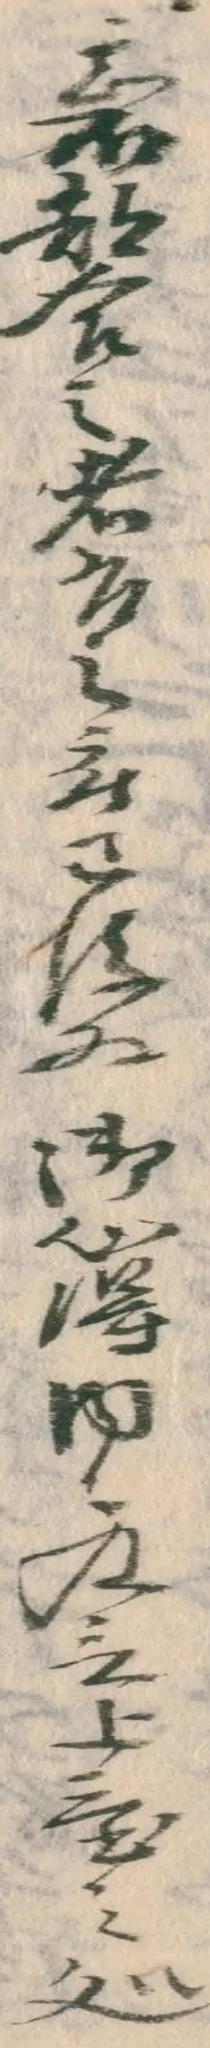ニ而都合之者有之ニ付已後為御心得内々及言上置之処
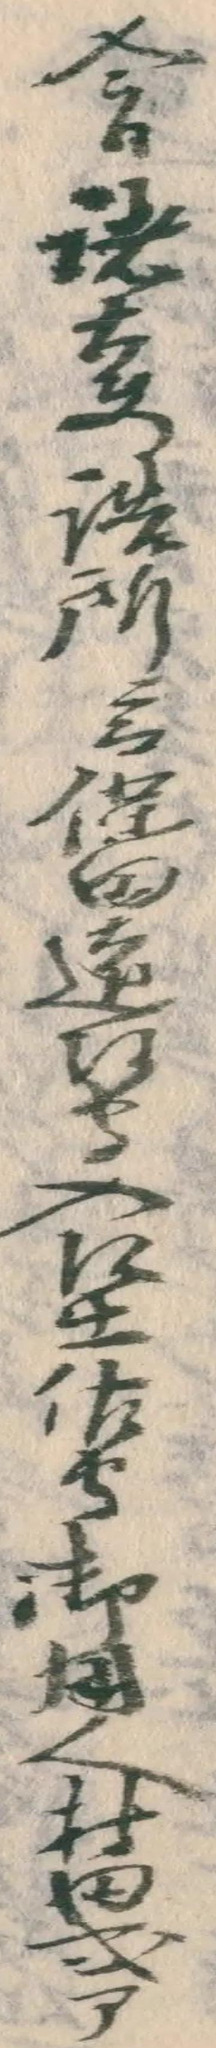今日諸大夫詰所ニ而保田遠江守入江土佐守御用人村田式部
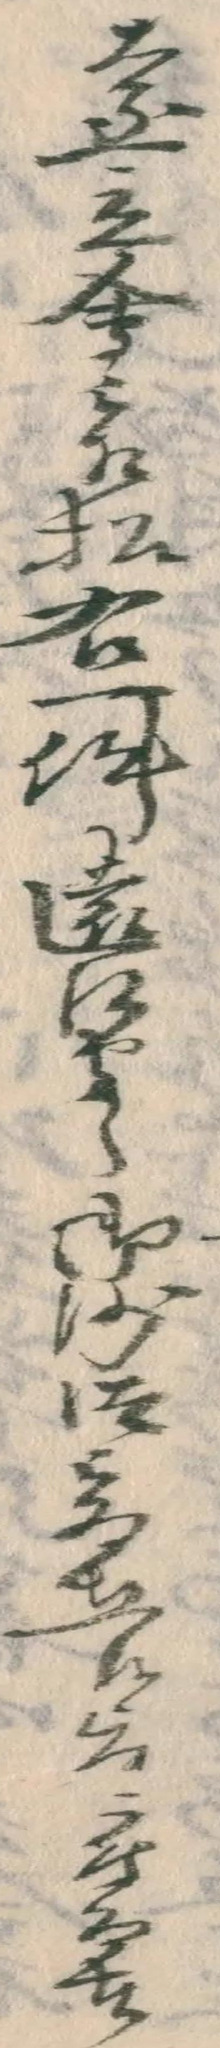大丞立會被相招右一件遠江守ヘ御沙汰被為在候旨ニ付而は
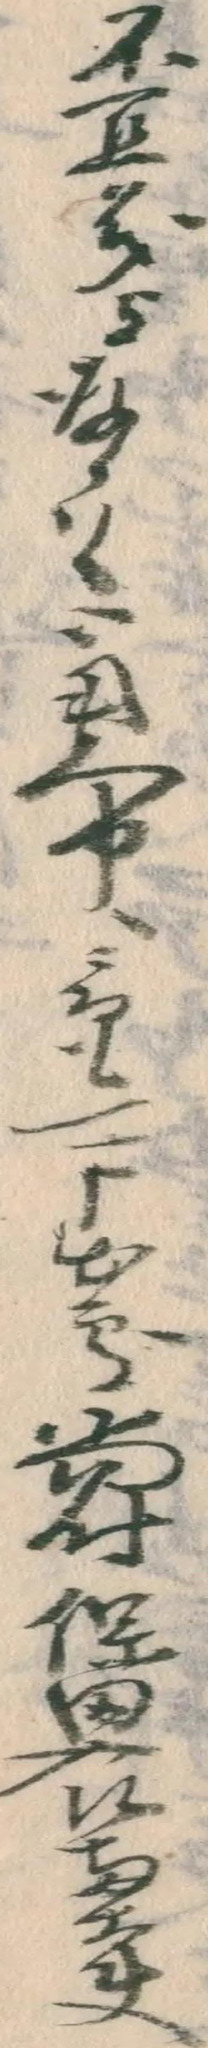不宜義と存候ハヽ御用人中へニ而も可申出處當時保田入江両大夫
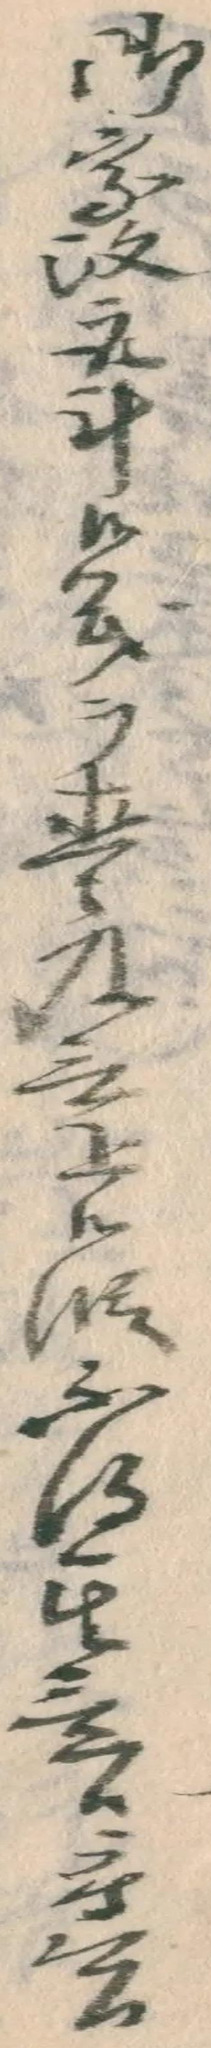御家政取斗候義を直々及言上候段不得其意候ニ付今日
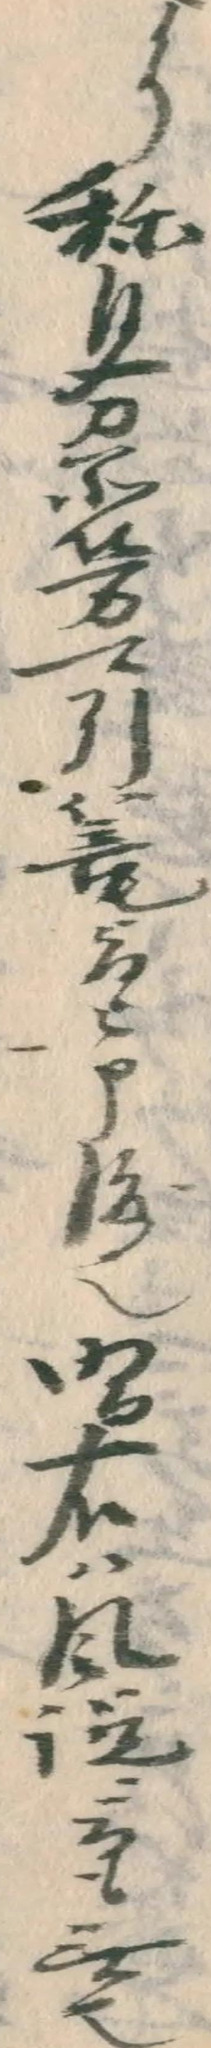より称自分所労可引篭旨被申渡也仍而右ハ風説ニ而も無之
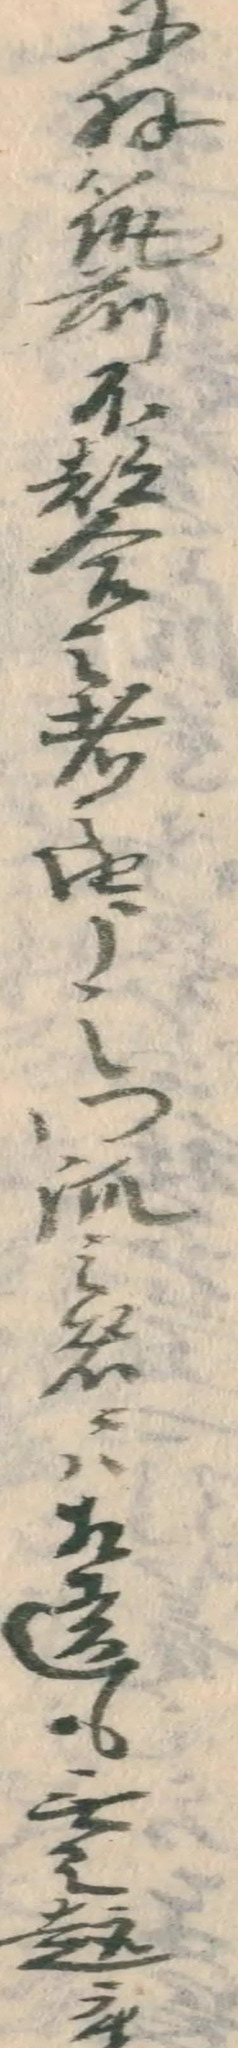丹羽筑前不都合之者之由之門流之者ニハ相違も無之趣ニ付
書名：賀茂社記録. 第70冊
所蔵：国立国会図書館 National Diet Library, JAPAN
